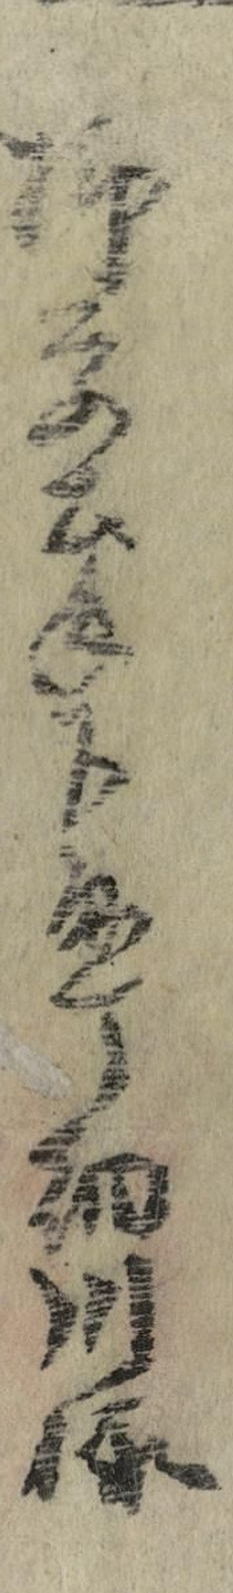柳原土手下通丁細川様
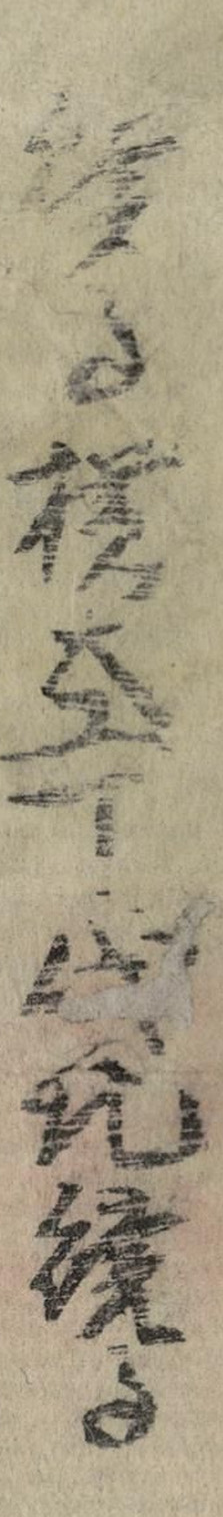焼る横大工丁代地焼る
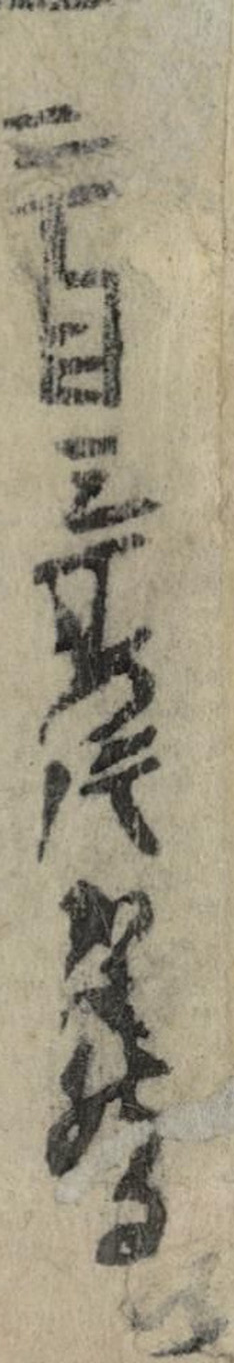二丁目三丁め片かわ残る
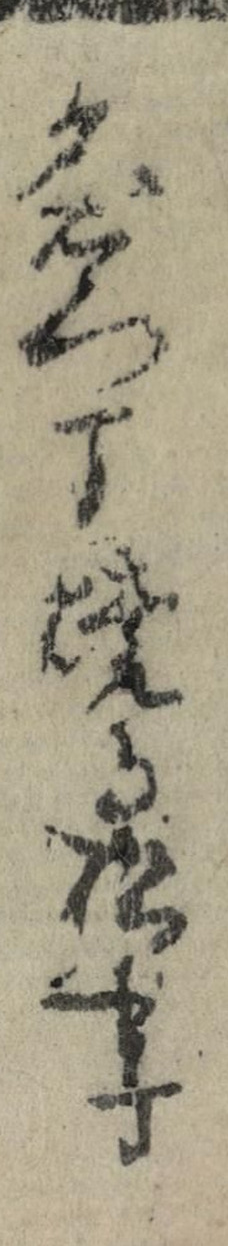久右衛門丁焼る橋本丁
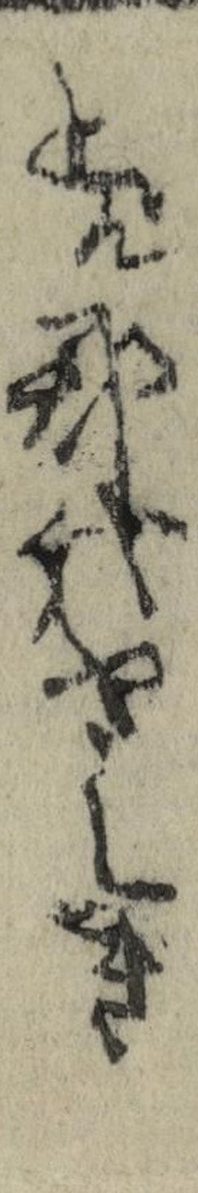止ル郡代やしき
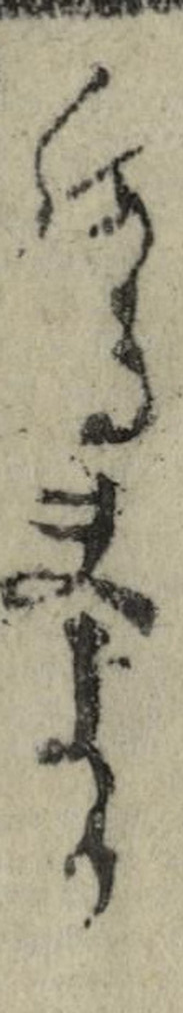止る夫より
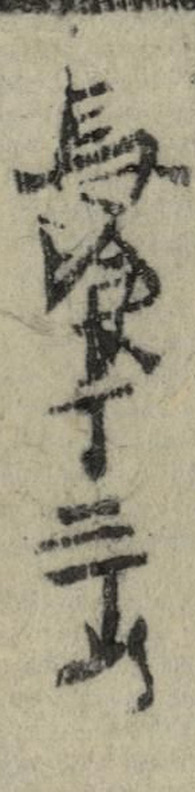馬喰丁二丁め
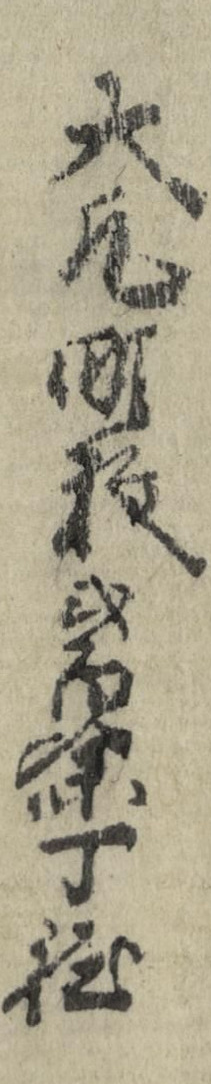大凡町数弐百余丁程
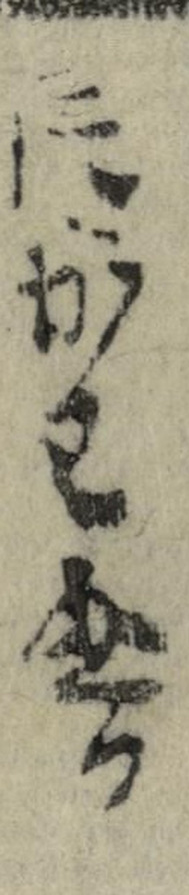片かわ通り
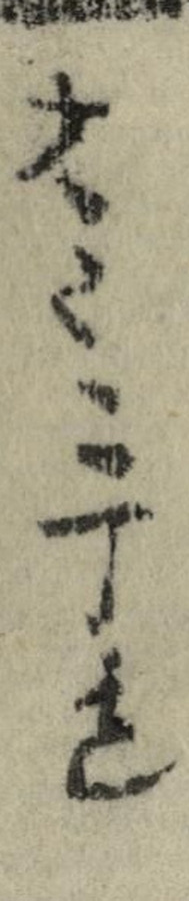はたこ丁迄
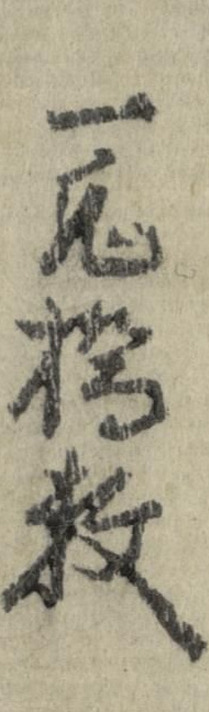一凡橋数
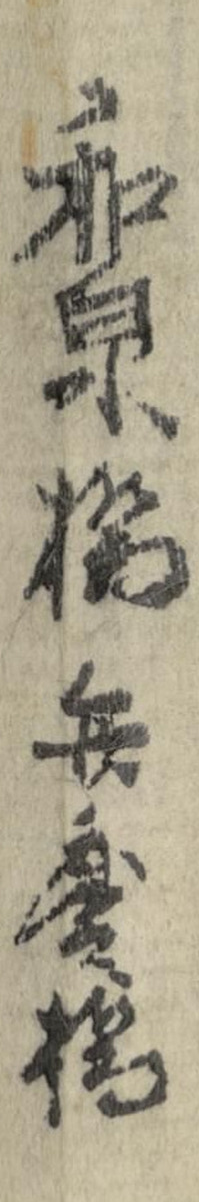和泉橋弁慶橋
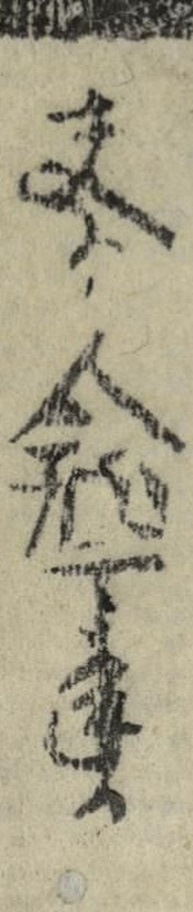夫ゟ人形丁通り
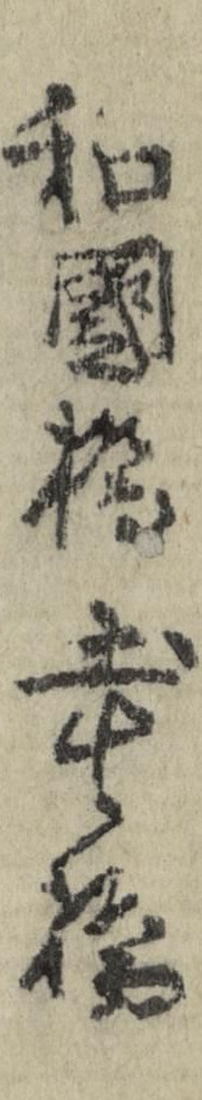和国橋土生橋
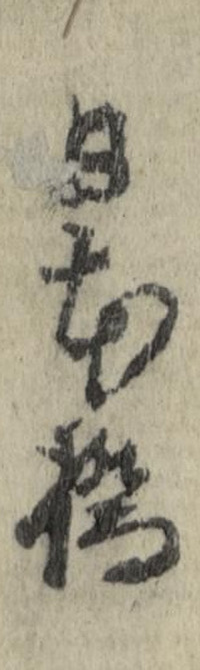日本橋
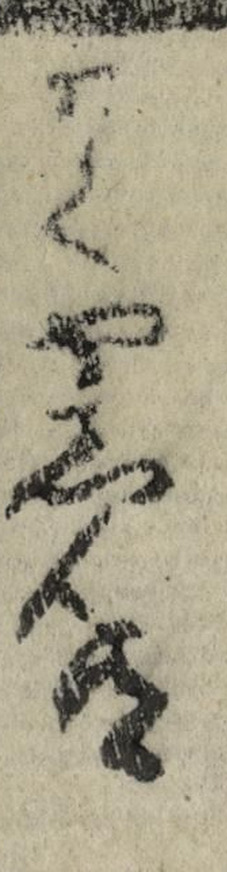かくやしん道
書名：焼場所方角繪圖
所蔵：東京大学地震研究所図書室 Earthquake Research Institute Library, The University of Tokyo, JAPAN
